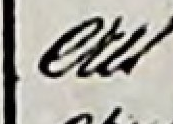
Alt
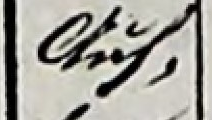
Aus„
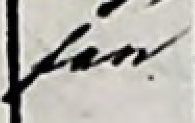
„see
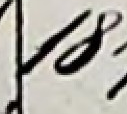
18
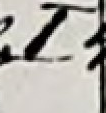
I
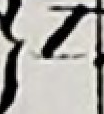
I
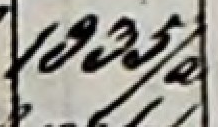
1335/a
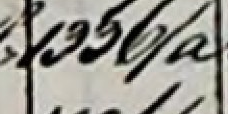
1336/a
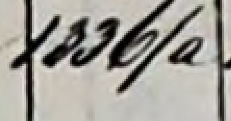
1336/a
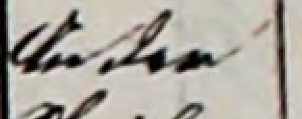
An der
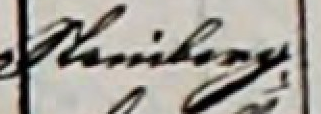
Steinberg„
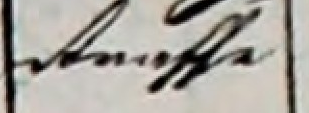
strasse
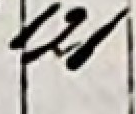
121
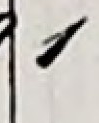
1
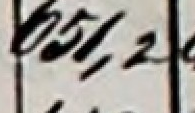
651,2
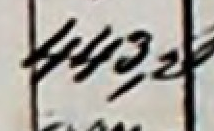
443,2
